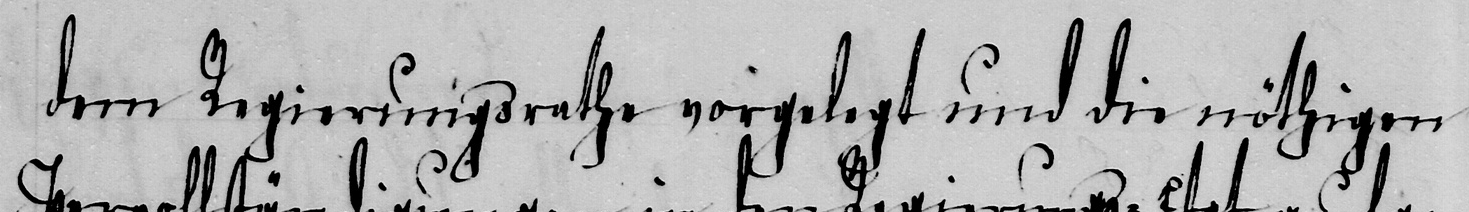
dem Regierungsrathe vorgelegt und die nöthigen
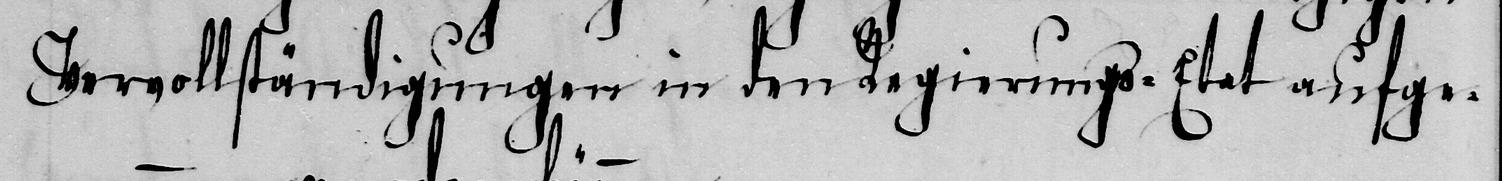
Vervollständigungen in den Regierungs-Etat aufge¬
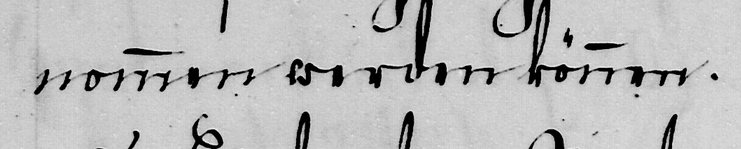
nommen werden können.
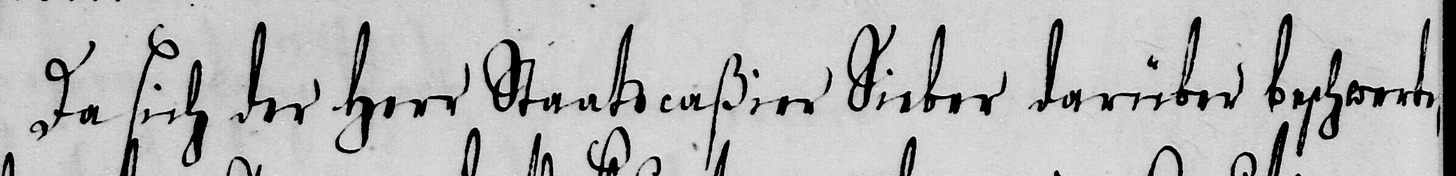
Da sich der Herr Staatscaßier Sieber darüber beschwer¬
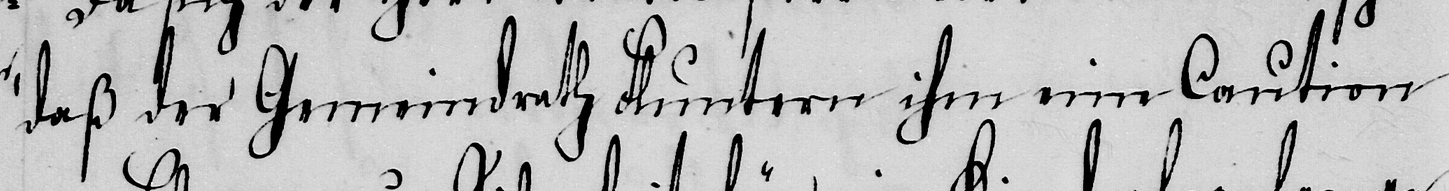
daß der Gemeindrath Fluntern ihm eine Caution
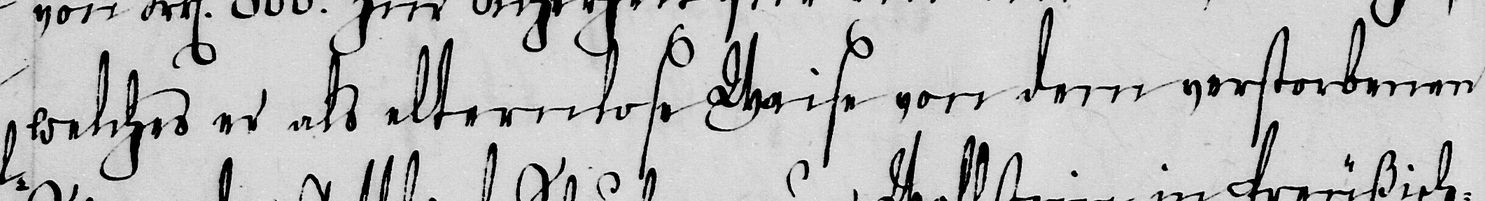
welches er als elternlose Waise von dem verstorbenen
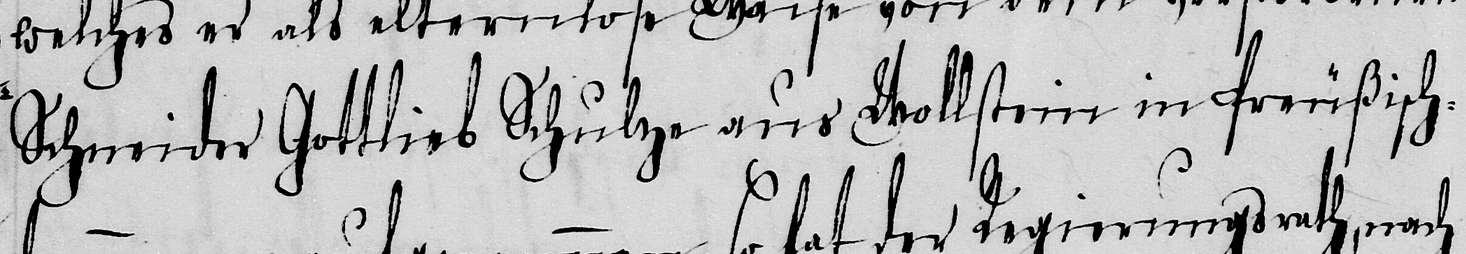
Schneider Gottlieb Schulze aus Wollstein in Preußisc¬
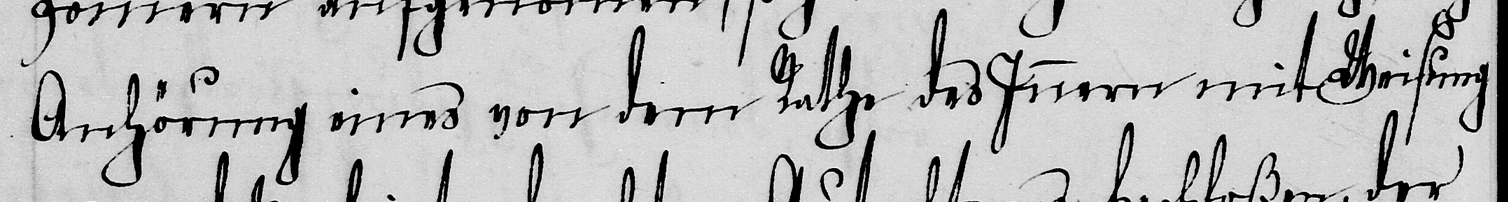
Anhörung eines von dem Rathe des Innern mit Weisung
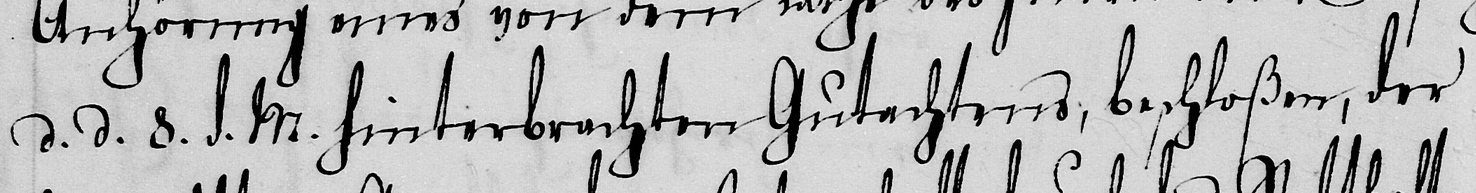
d. d. 8. d. M. hinterbrachten Gutachtens, beschloßen, der
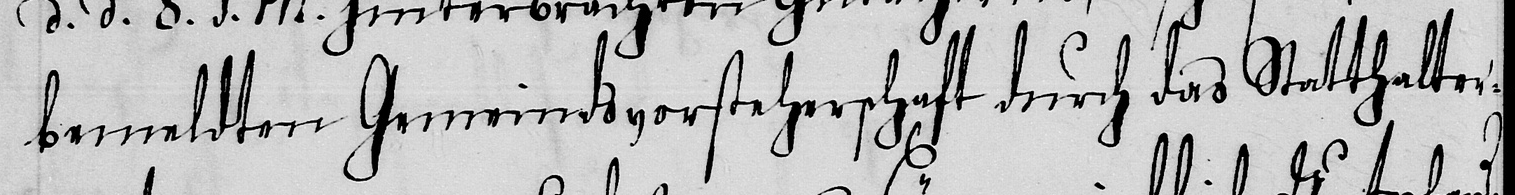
bemeldten Gemeindsvorsteherschaft durch das Statthalte¬
